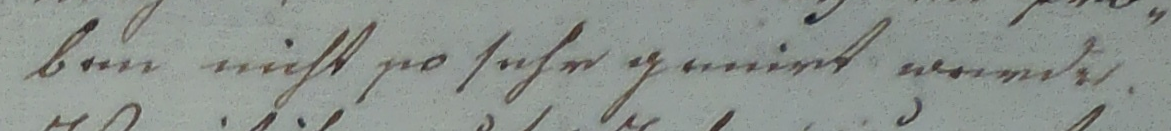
ben nicht so sehr genirt werde.
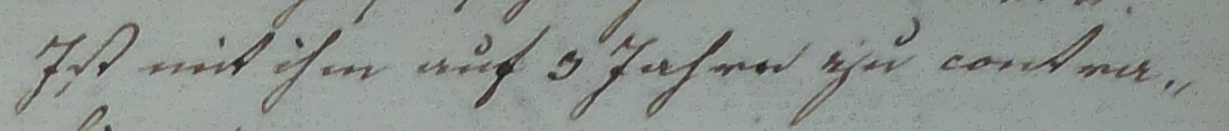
Ist mit ihm auf 3 Jahre zu contra¬
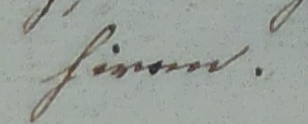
hiren.
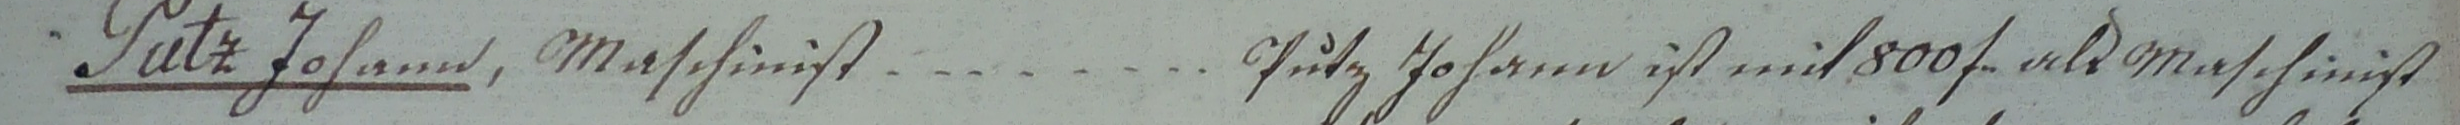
Putz Johann, Maschinist …….. Putz Johann ist mit 800 fn als Maschinist
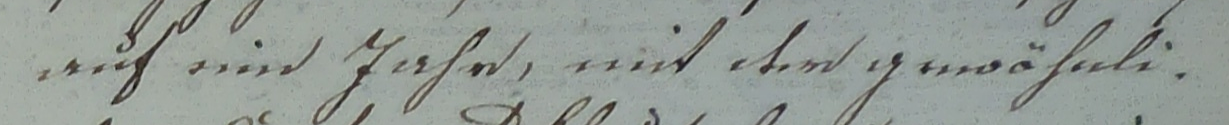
auf ein Jahr, mit der gewöhnli¬
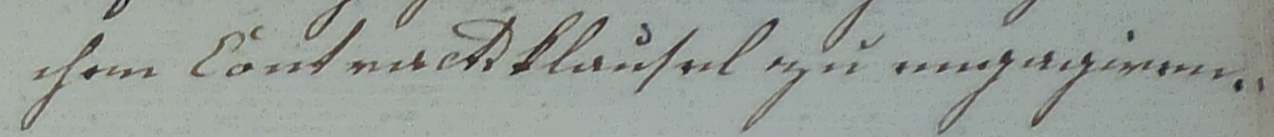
chen Contractsklausel zu engagiren.
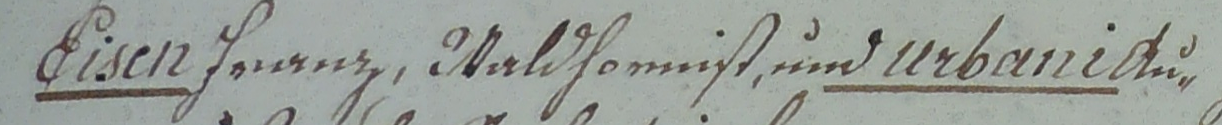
Eisen Franz, Waldhornist, und Urbani Au¬
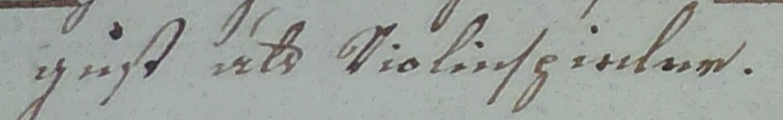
gust als Violinspieler.
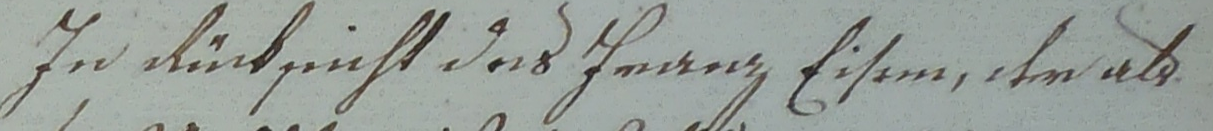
In Rücksicht des Franz Eisen, der als
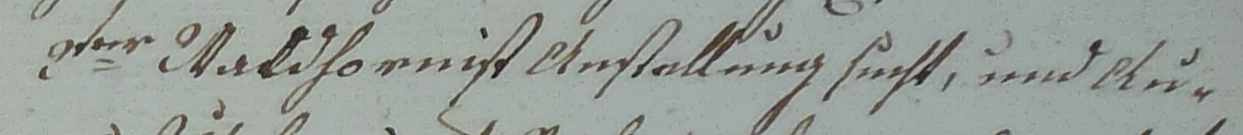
3te͇r Waldhornist Anstellung sucht, und Au¬
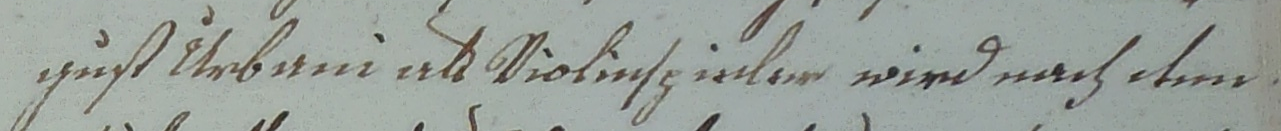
gust Urbani als Violinspieler wird nach dem
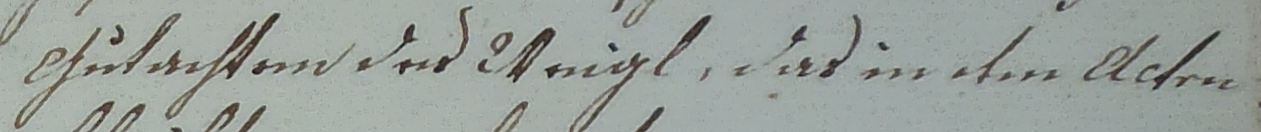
Gutachten des Weigl, das in den Acten
